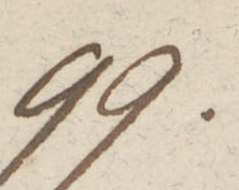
99.
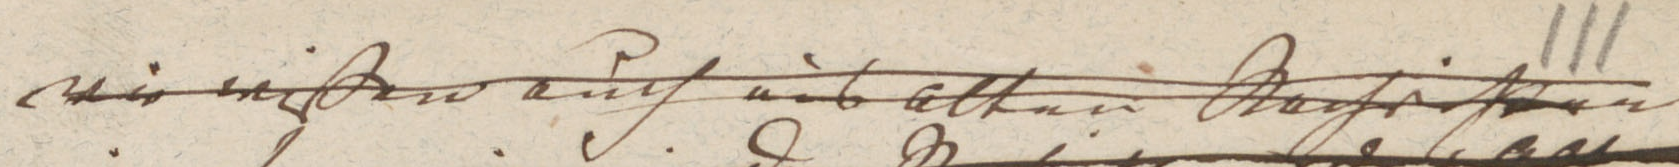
wir wissen auch aus alten Nachrichten
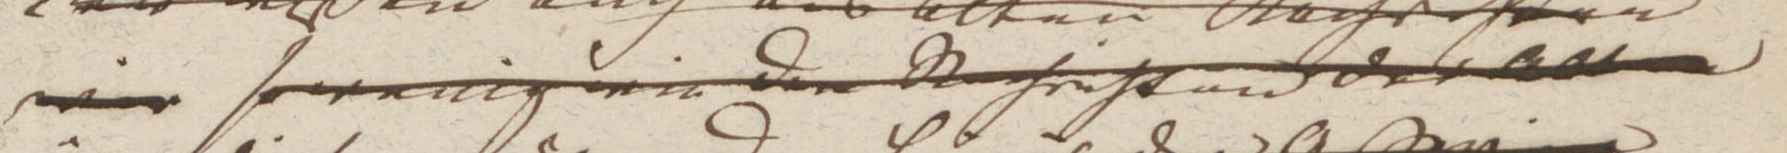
wir so wenig wie den Nachrichten der Alten
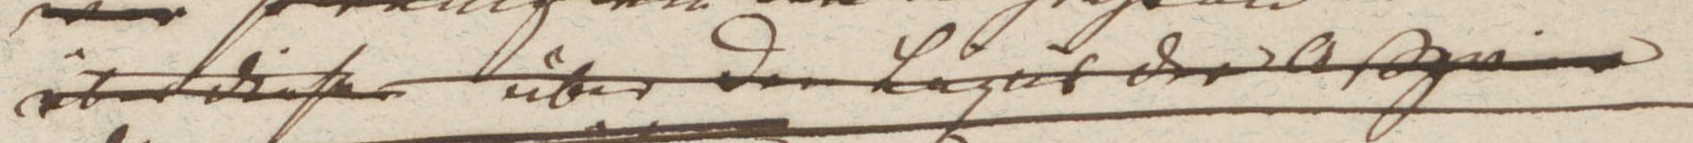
über diesen über den Luxus der Assyrier
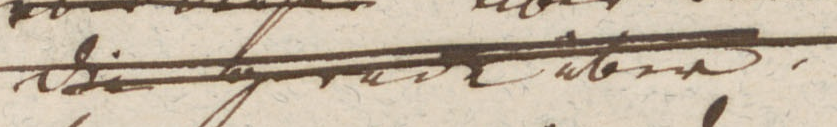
die gerade über
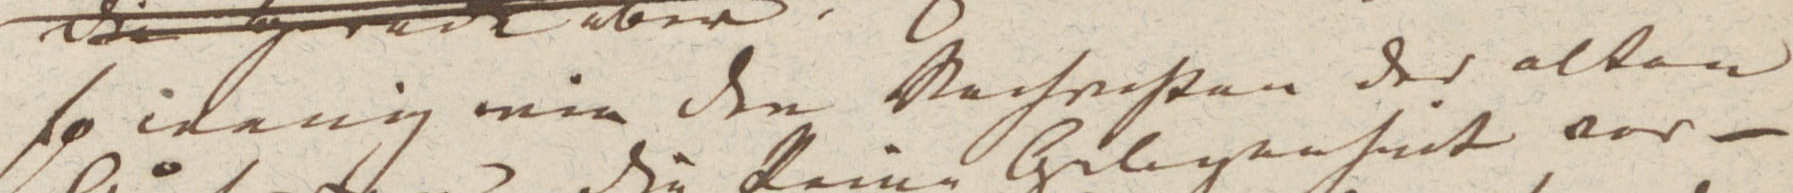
so wenig wie den Nachrichten der alten
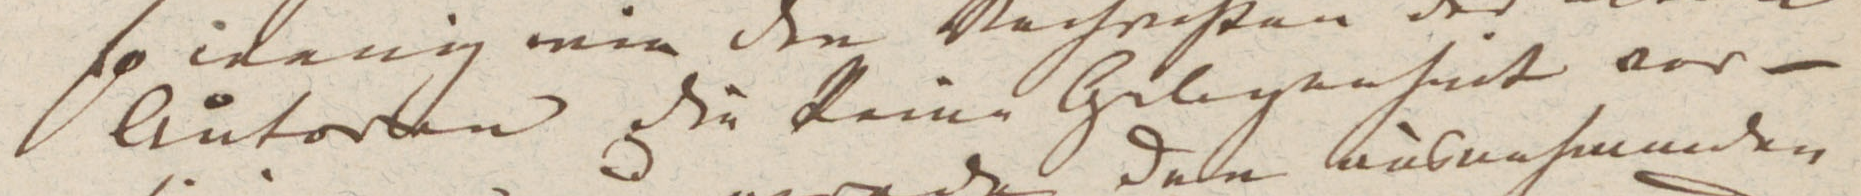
Autoren die keine Gelegenheit ver-
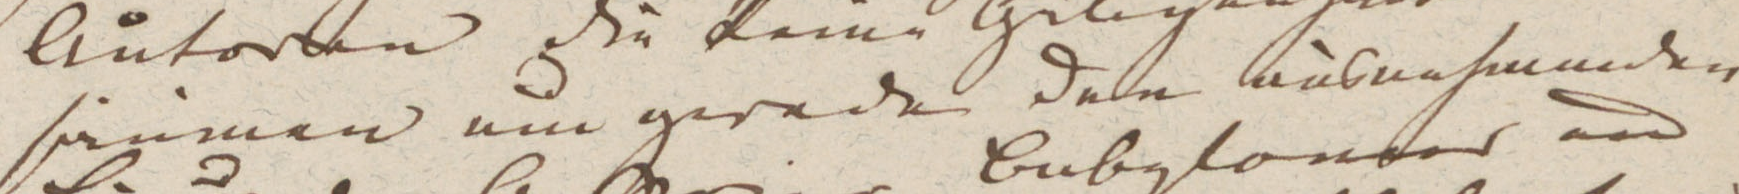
säumen um gerade den ausnehmenden
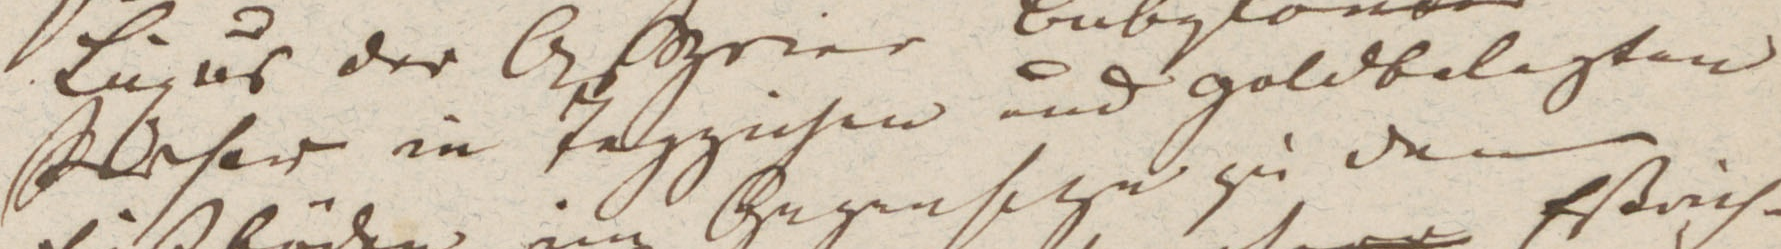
Perser in Teppichen und goldbelegten
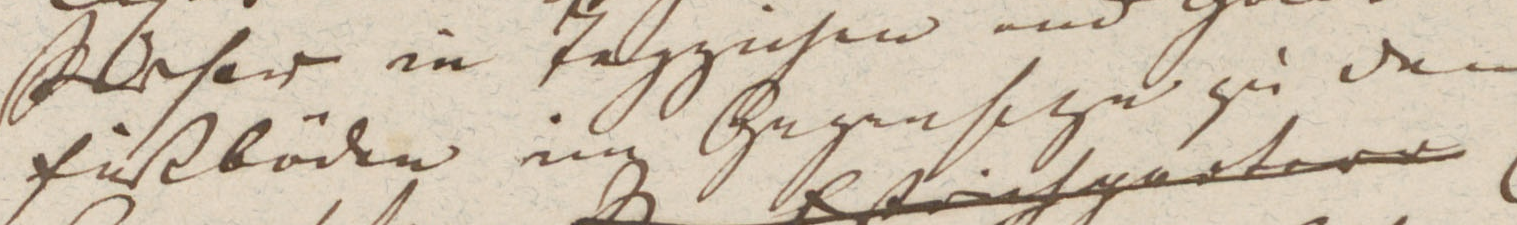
Fussböden im Gegensatze zu den
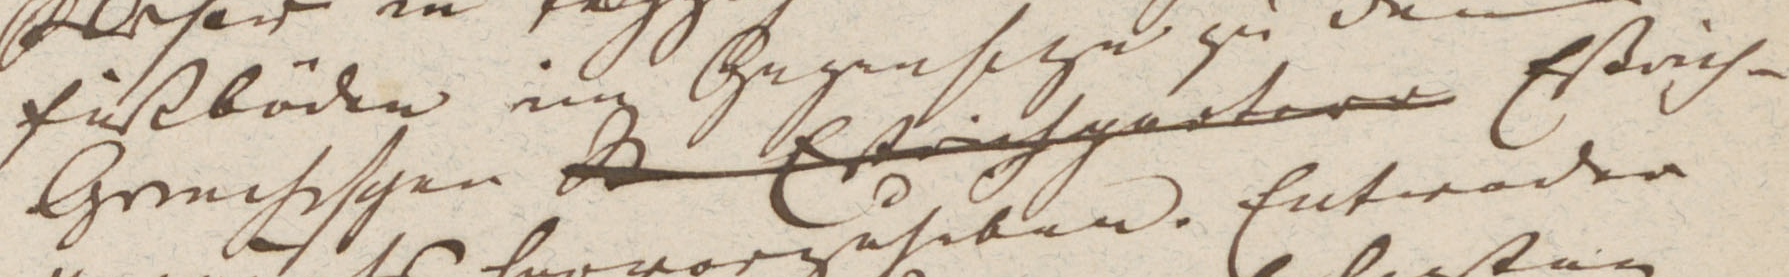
Griechischen S Estrich Estrich-
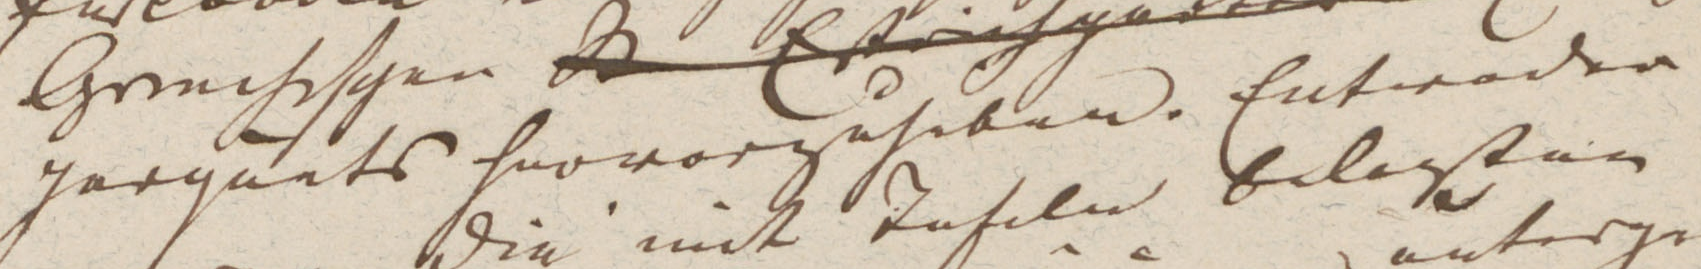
parquets hervorzuheben. Entweder
